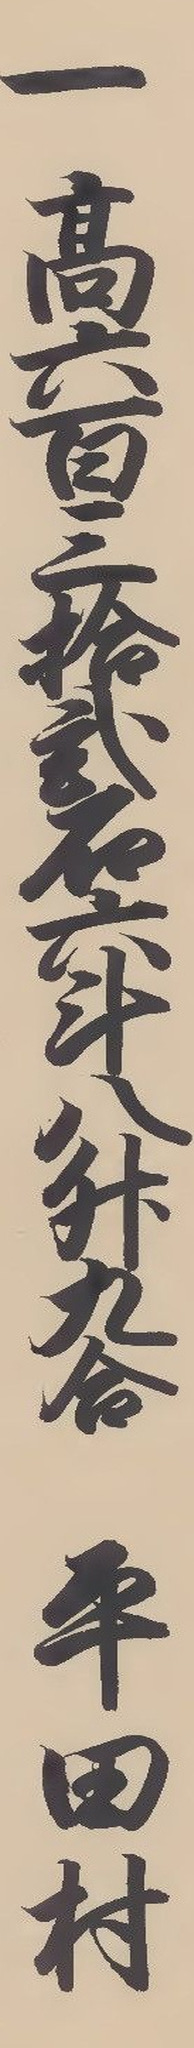一高六百三拾弐石六斗八升九合平田村
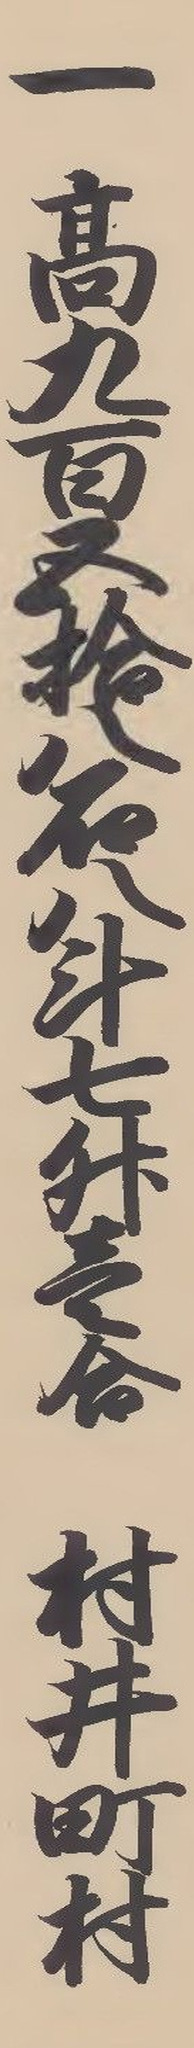一高九百五拾八石八斗七升壱合村井町村
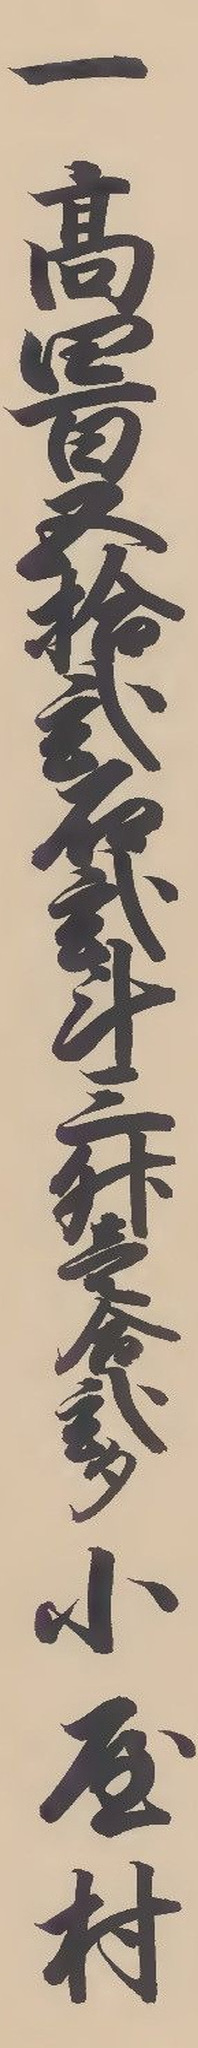一高四百五拾弐石弐斗三升壱合弐勺小屋村

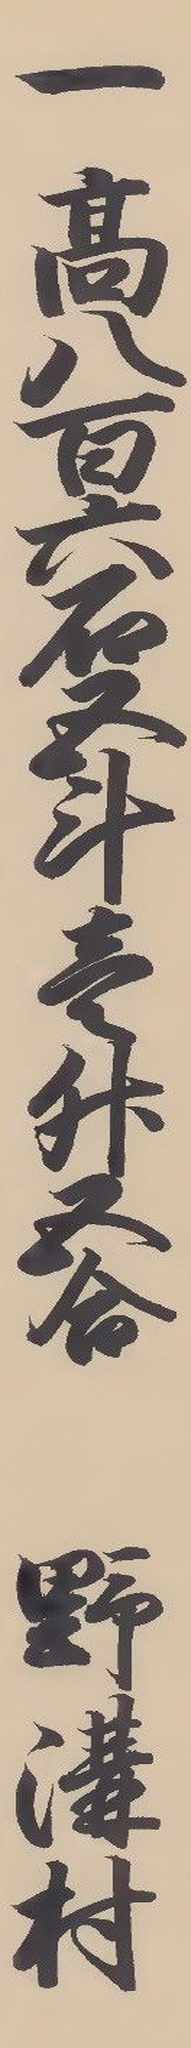一高八百六石五斗壱升五合野溝村
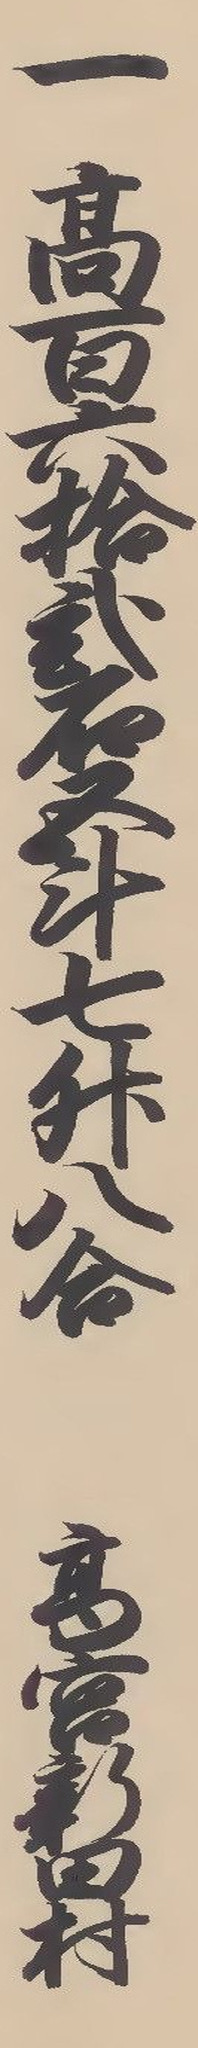一高百六拾弐石五斗七升八合高宮新田村
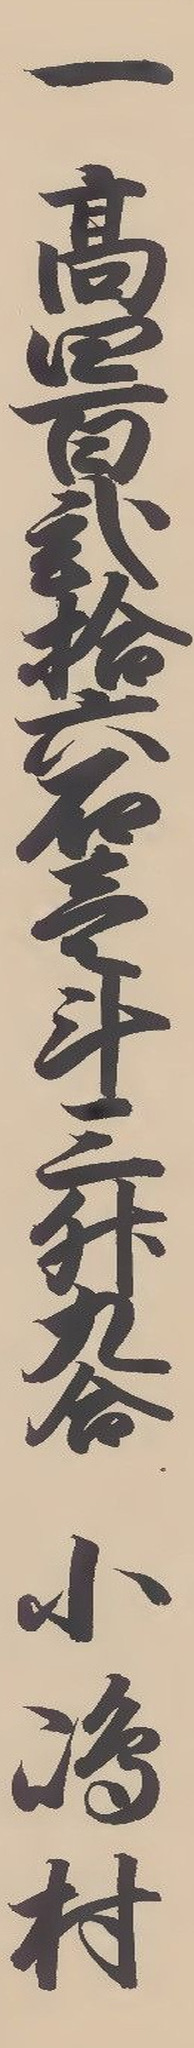一高四百弐拾六石壱斗三升九合小島村
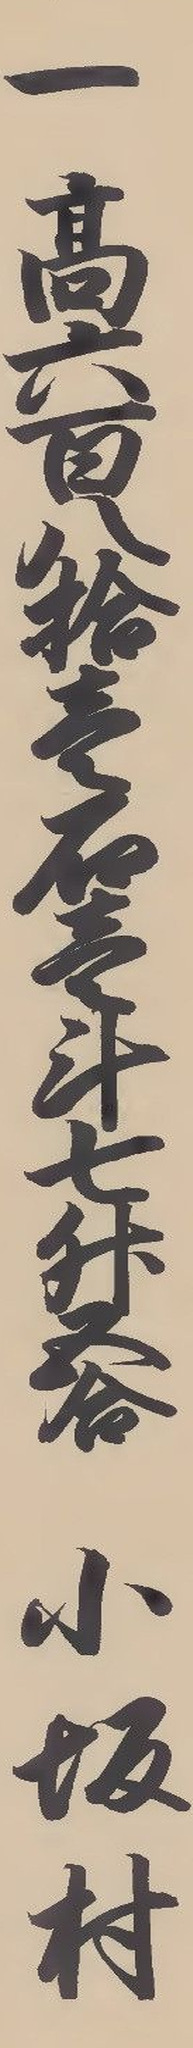一高六百八拾壱石壱斗七升五合小坂村
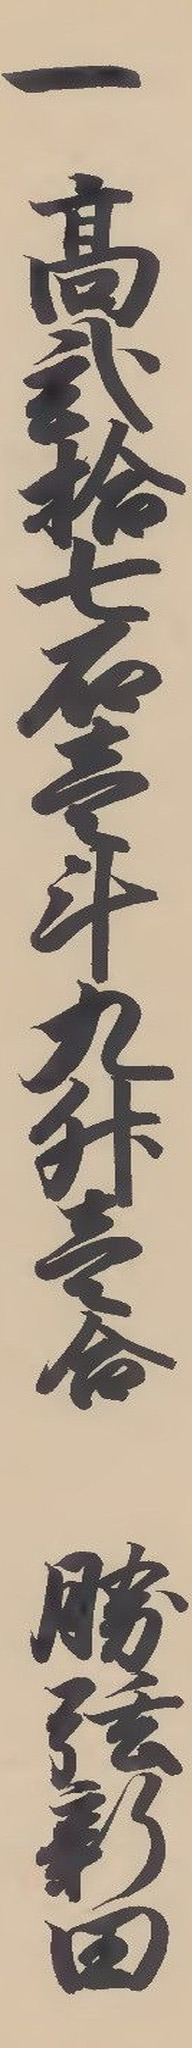一高弐拾七石壱斗九升壱合勝弦新田
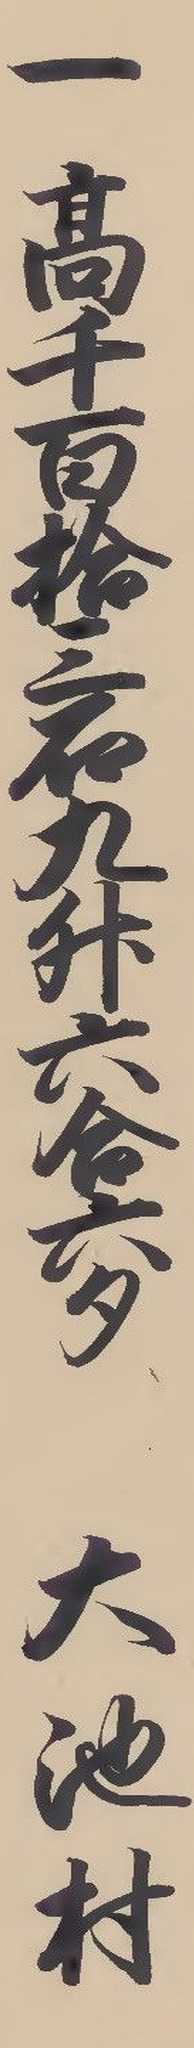一高千百拾三石九升六合六勺大池村

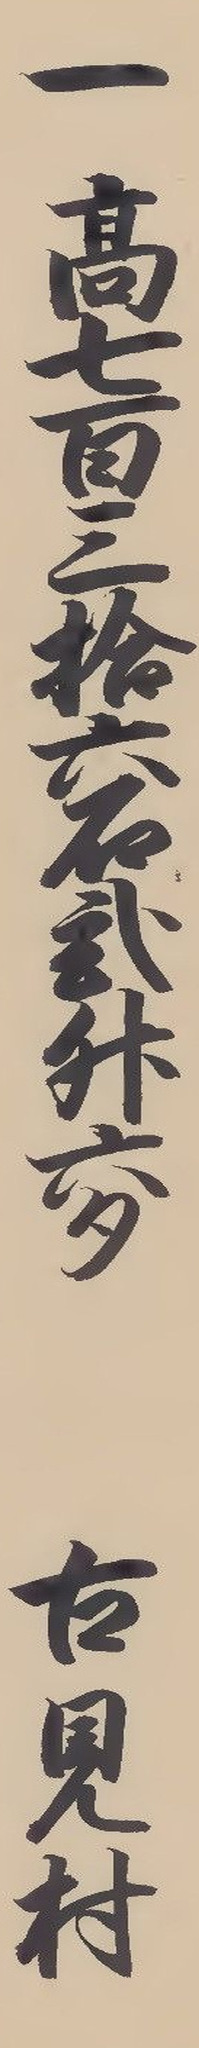一高七百三拾六石弐升六勺古見村
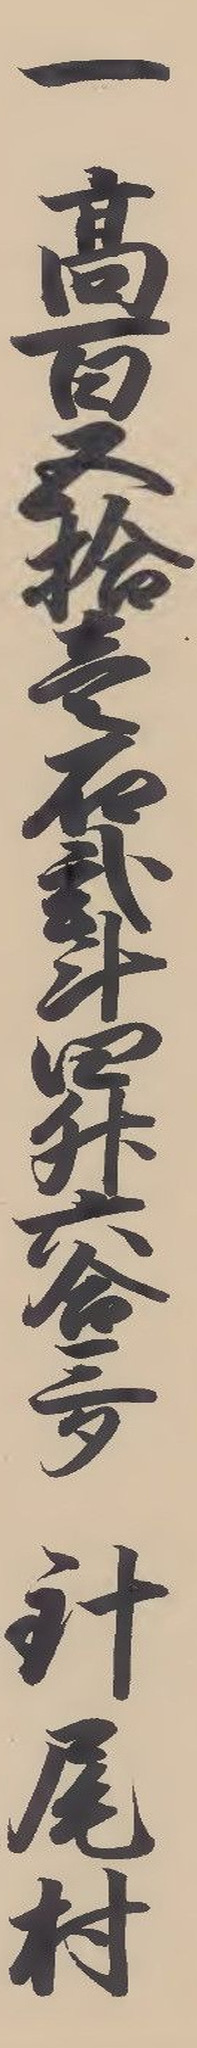一高百五拾壱石弐斗四升六合三勺針尾村
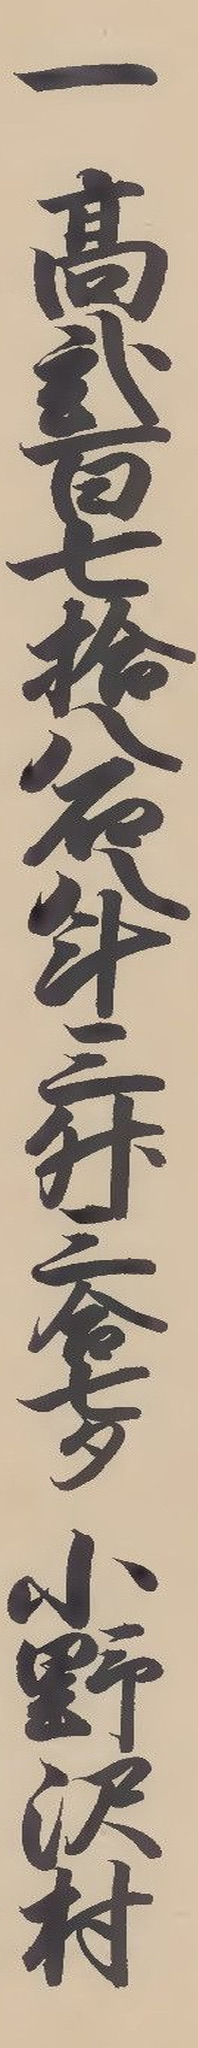一高弐百七拾八石八斗三升三合七勺小野沢村
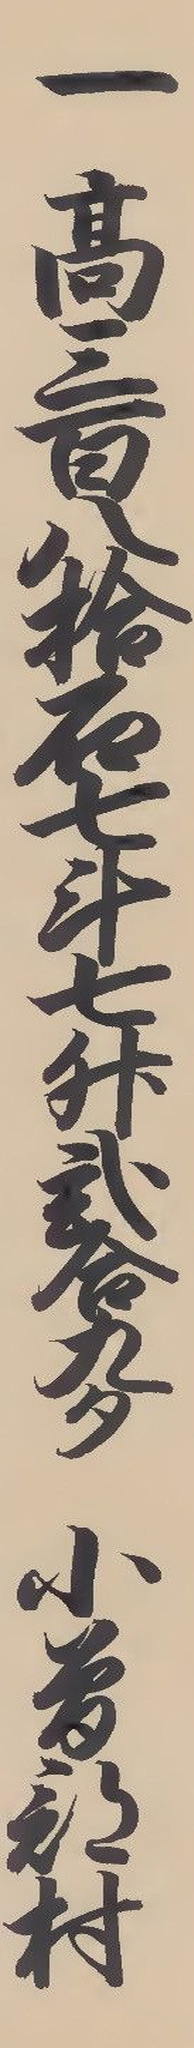一高三百八拾石七斗七升弐合九勺小曽部村
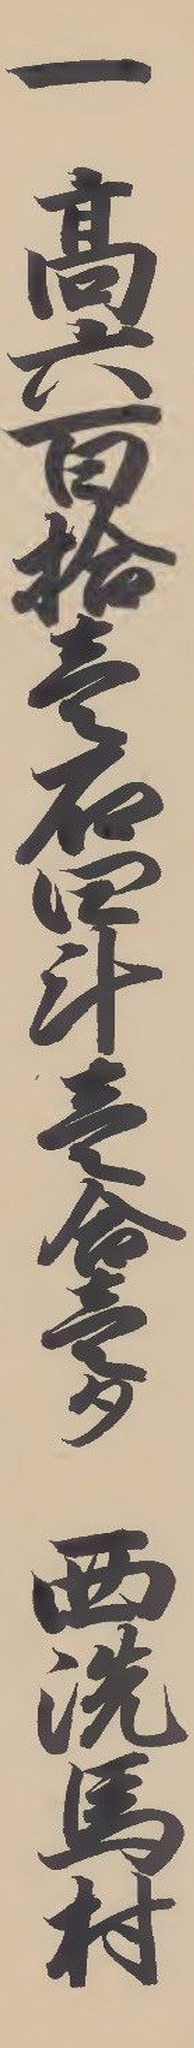一高六百拾壱石四斗壱合壱勺西洗馬村
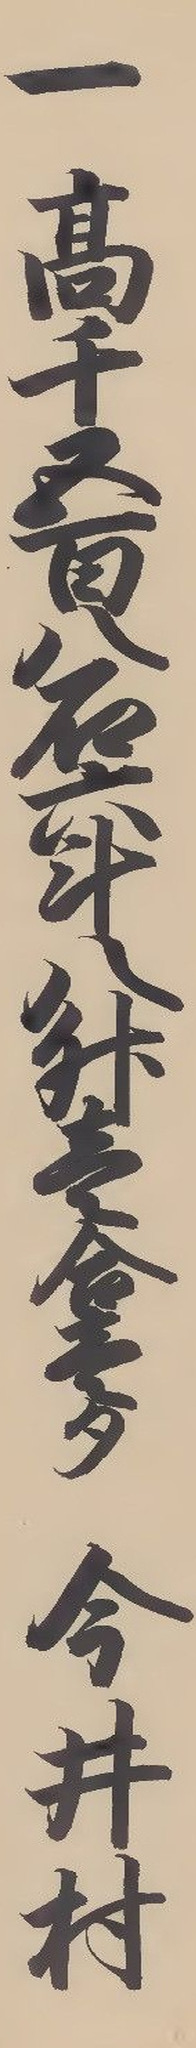一高千五百八石六斗八升壱合壱勺今井村
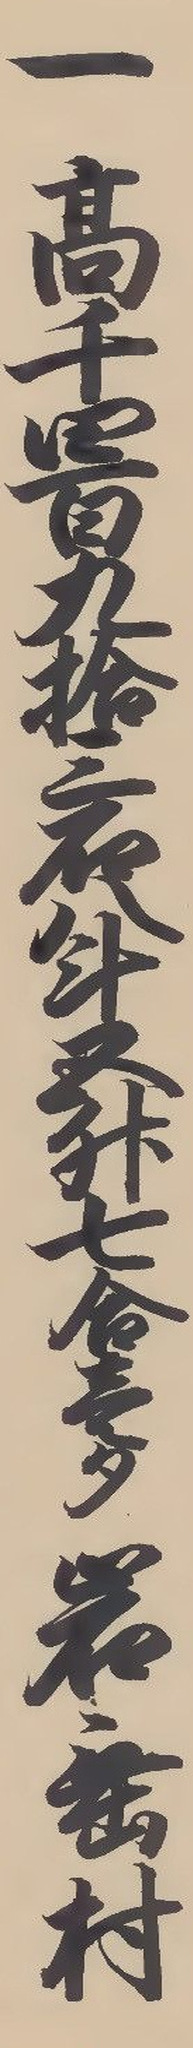一高千四百九拾三石八斗五升七合壱勺岩垂村
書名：信濃国郷帳
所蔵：国立公文書館 National Archives of Japan
